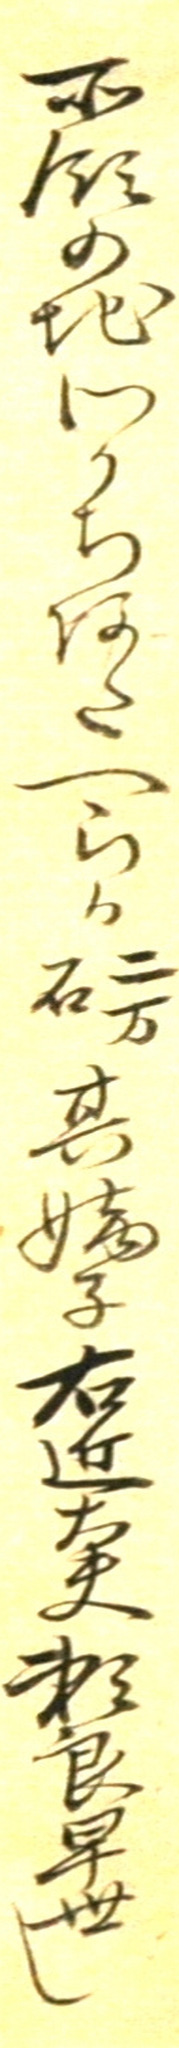所領の地わかちあたへらる二万石其嫡子右近大夫頼良早世し

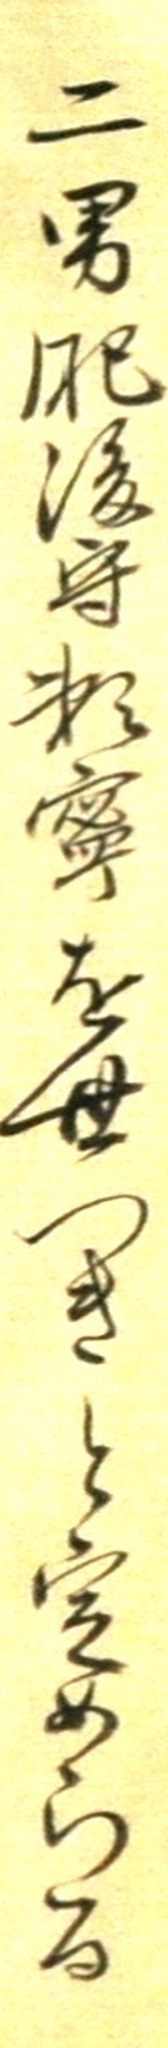二男肥後守頼寧を世つきと定めらる
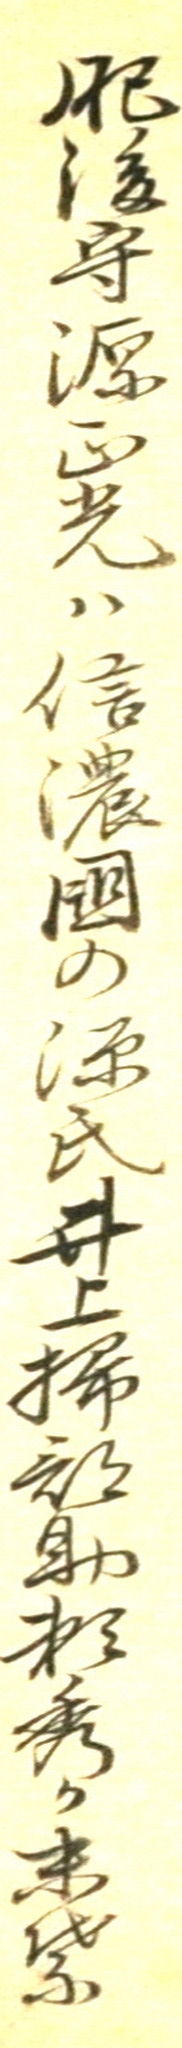肥後守正光は信濃国の源氏井上掃部助頼秀か末葉
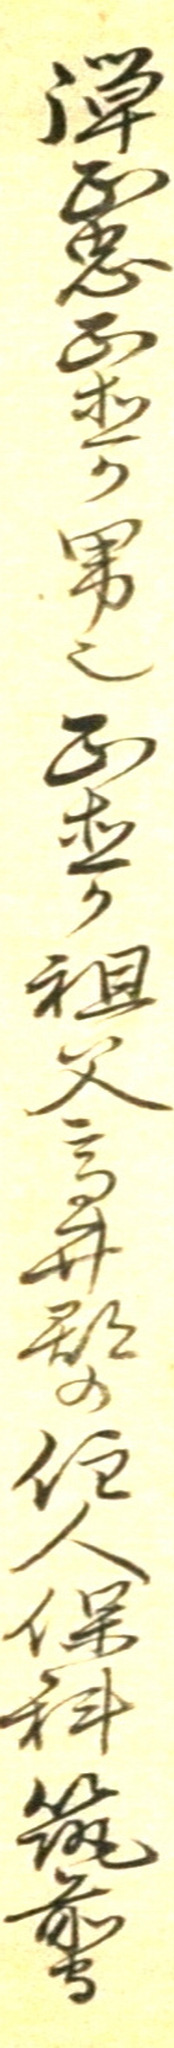弾正忠正直か男也正直か祖父高井郡の住人保科筑前守
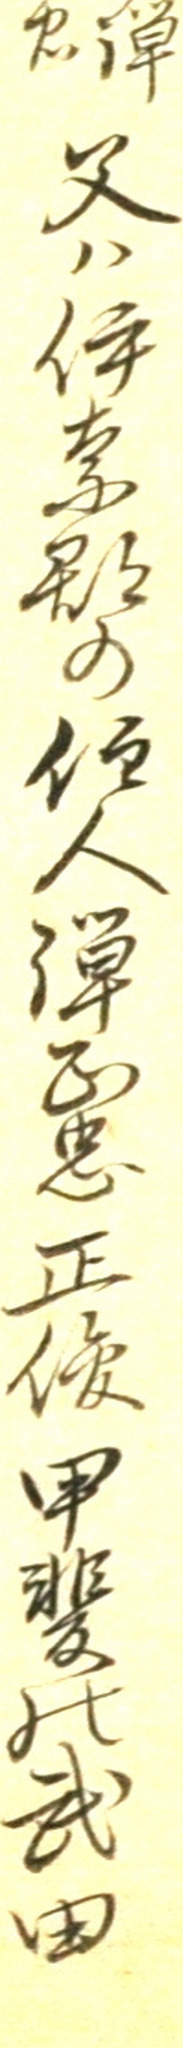正則初弾正忠父は伊奈郡の住人弾正忠正俊甲斐の武田
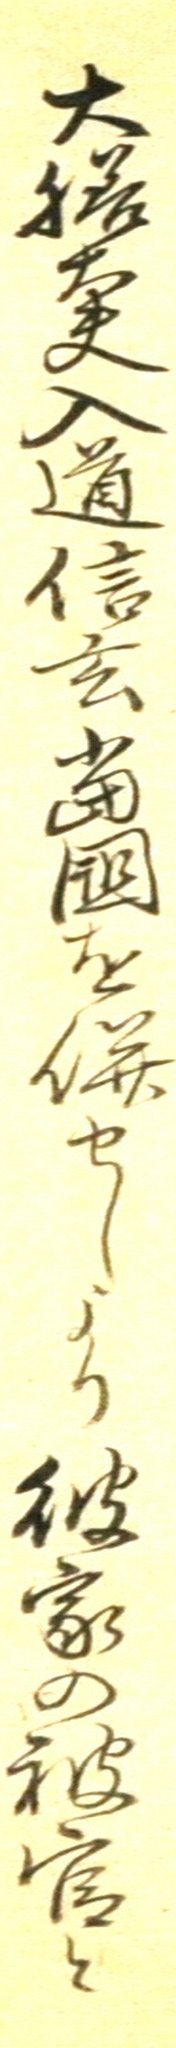大膳大夫入道信玄当国を併せしより彼家の被官と
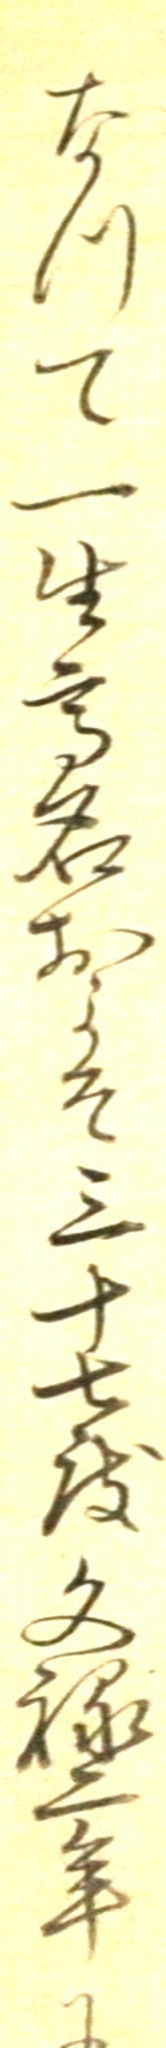なつて一生高名およそ三十七度文禄二年に至て
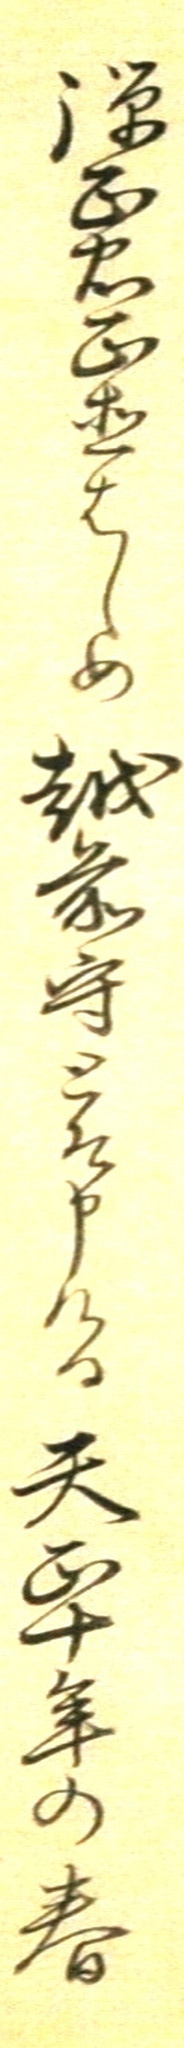弾正忠正直はしめ越前守とそ申ける天正十年の春
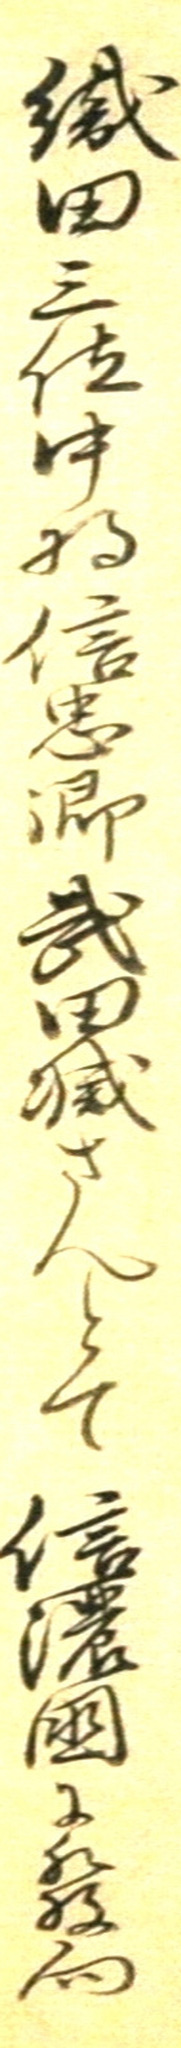織田三位中将信忠卿武田滅さんとて信濃国に発向

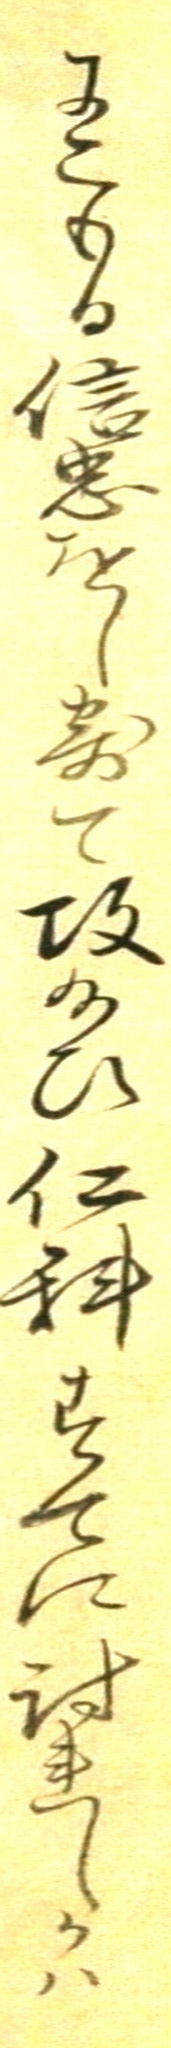にこもる信忠をし寄て攻給ひ仁科すてに討れしかは
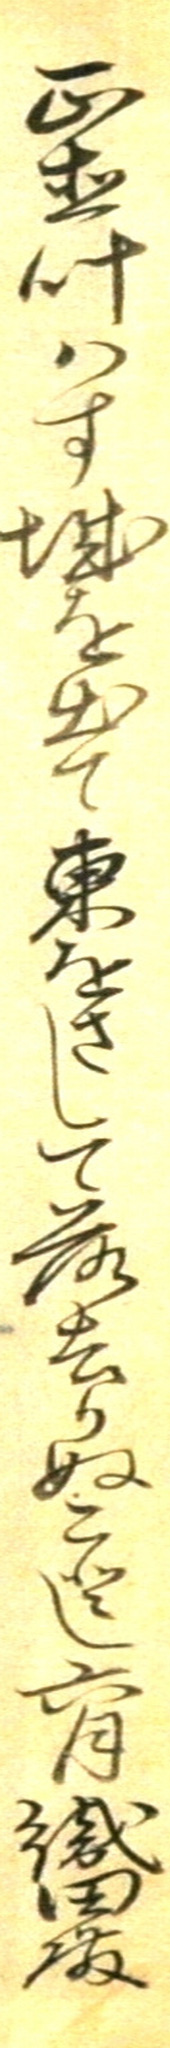正直叶はす城を出て東をさして落去りぬことし六月織田殿
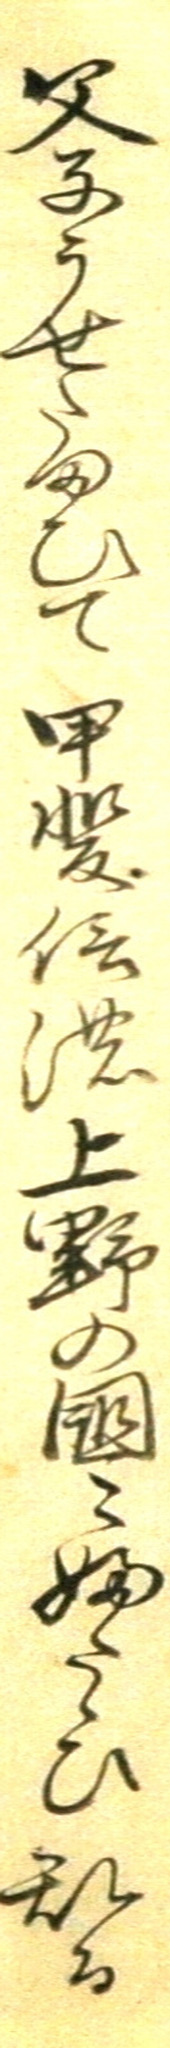父子うせたまひて甲斐信濃上野の国々ふたゝひ乱る
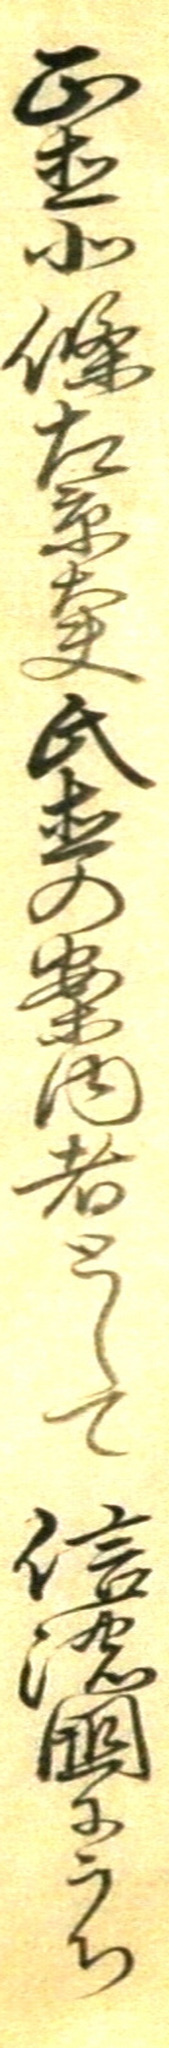正直北条左京大夫氏直の案内者として信濃国にうち
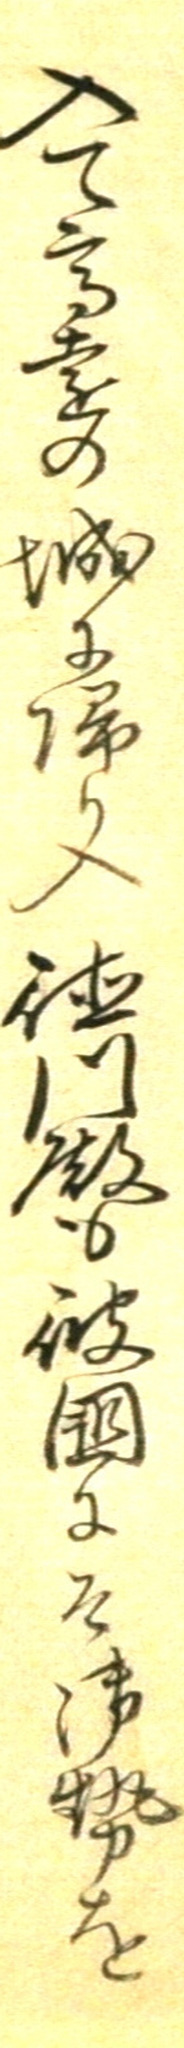入て高遠の城に帰り入徳川殿も彼国にそ御勢を
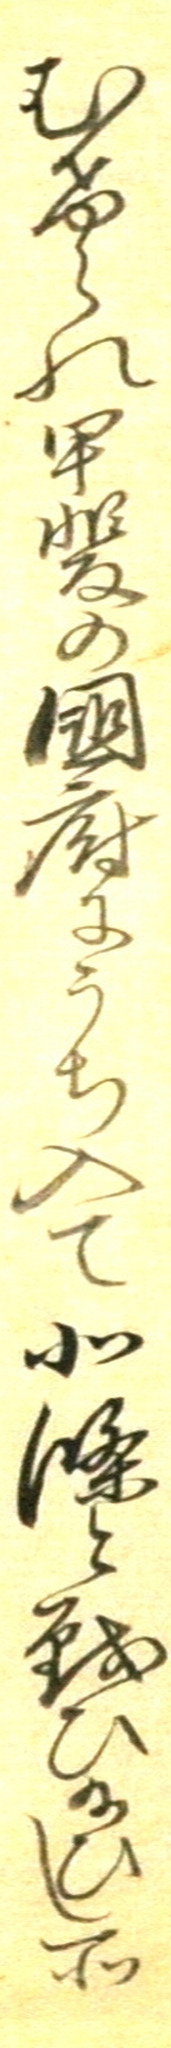むけられ甲斐の国府にうち入て北条と戦ひ給ひし所
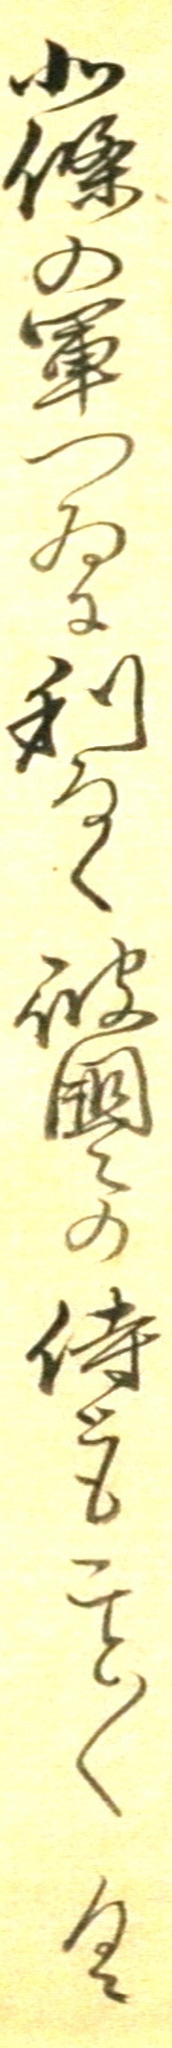北条の軍つゐに利なく彼国々の侍ともこと〳〵く
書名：藩翰譜（一）
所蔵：伊那市立高遠町図書館・合同会社AMANE
